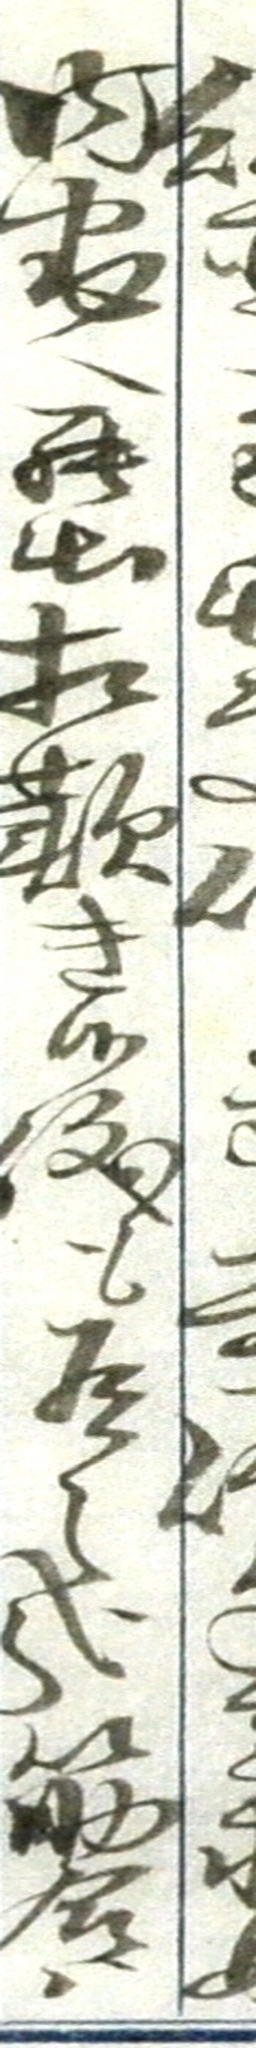内宅ヘ罷出相歎き候儀も有之哉筋合ハ
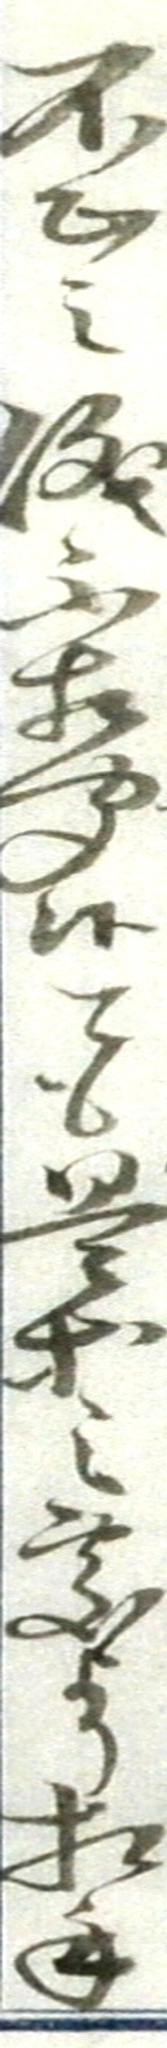不正之儀不相聞候ても是等之処より相手
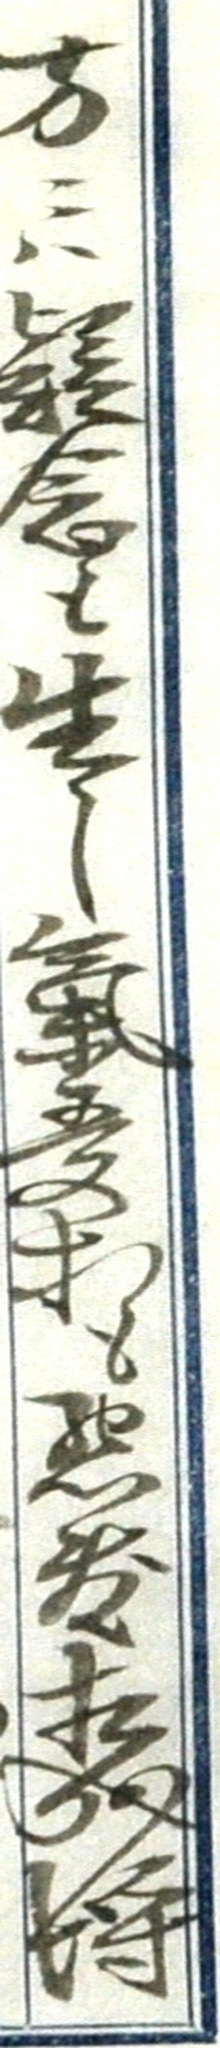方には疑念も生し気受等も悪敷相成埒
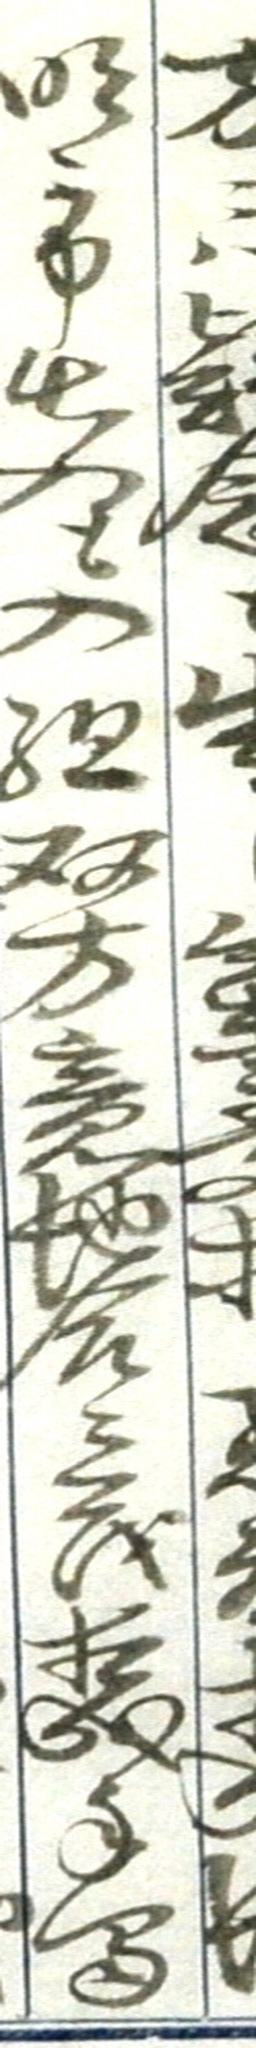明可申出入も入組双方意地合ニ茂相成手間
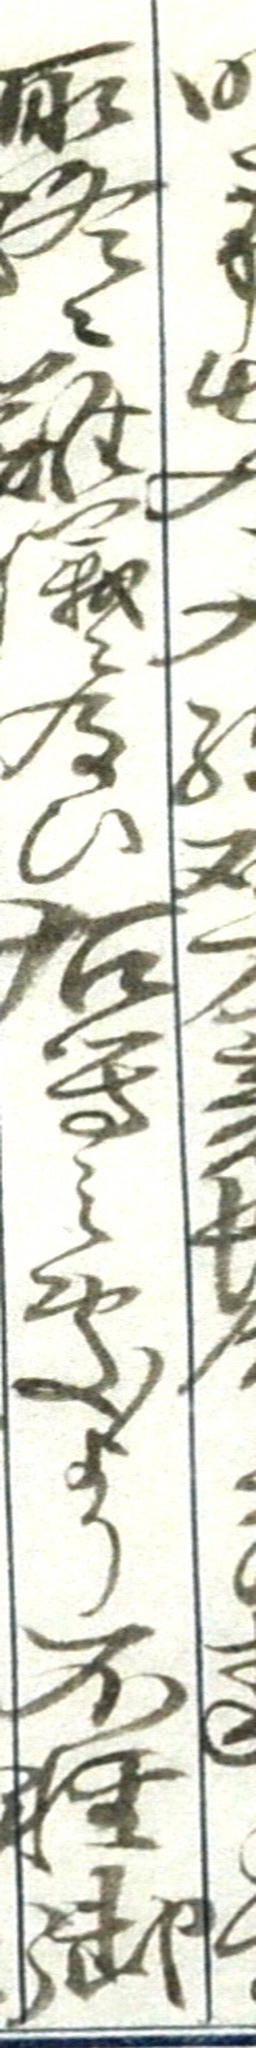取終ニ難儀ニ及ひ右等之処より不軽御
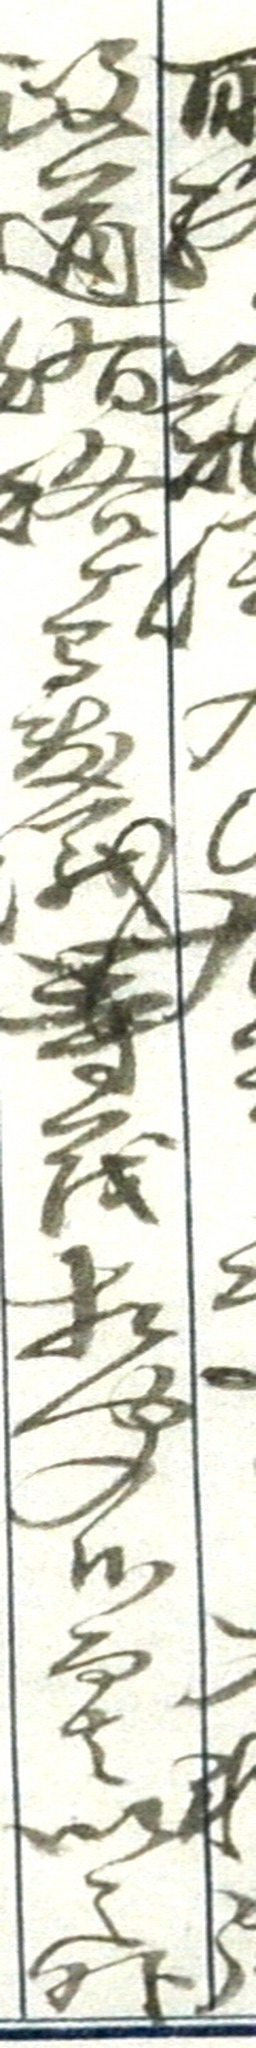政道賄賂が間敷儀等も相聞候ては以之外
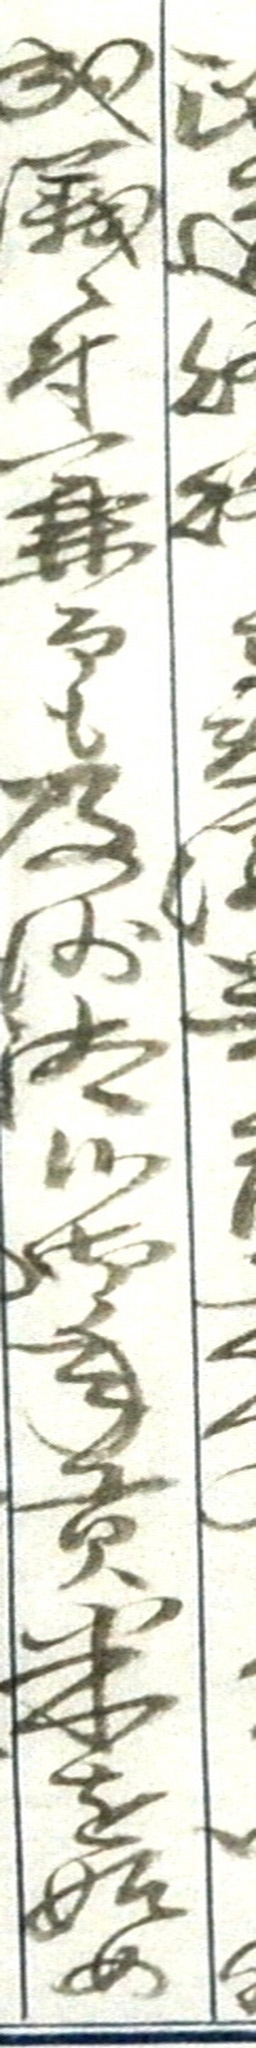成儀にニ付兼而も及沙汰候御年貢米を始め
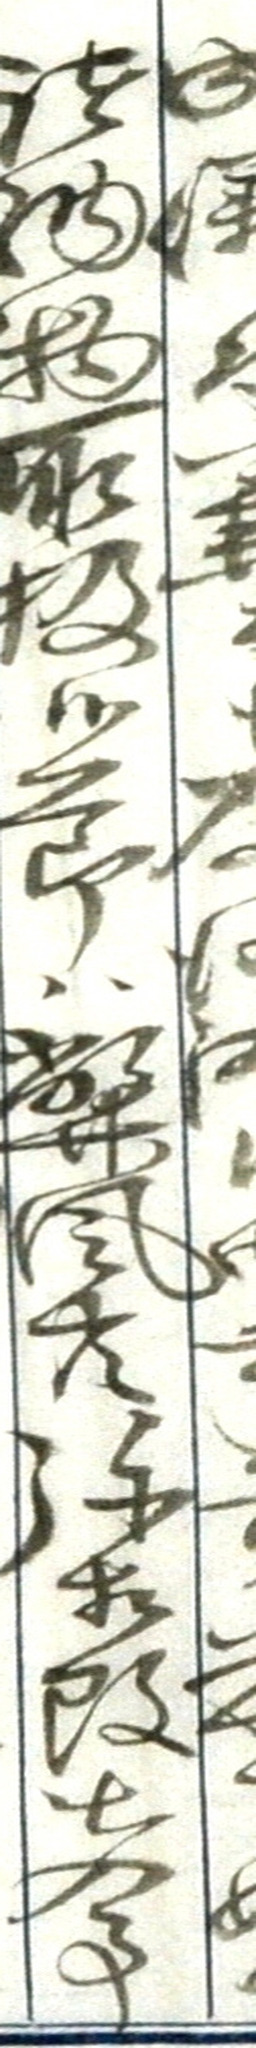諸納物取扱候節ハ弊風共弥相改出入事
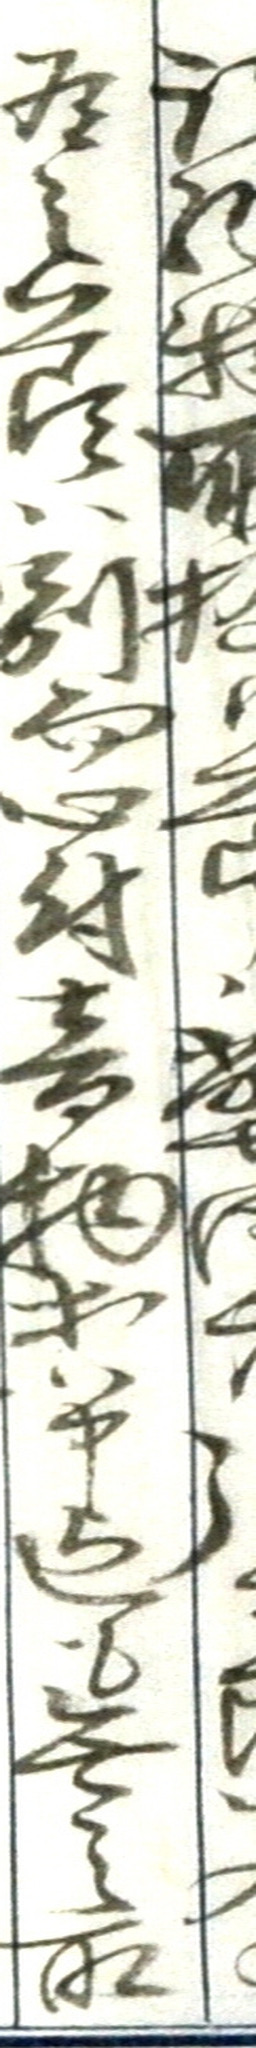有之節ハ別而心付音物等ハ申迄も無之取
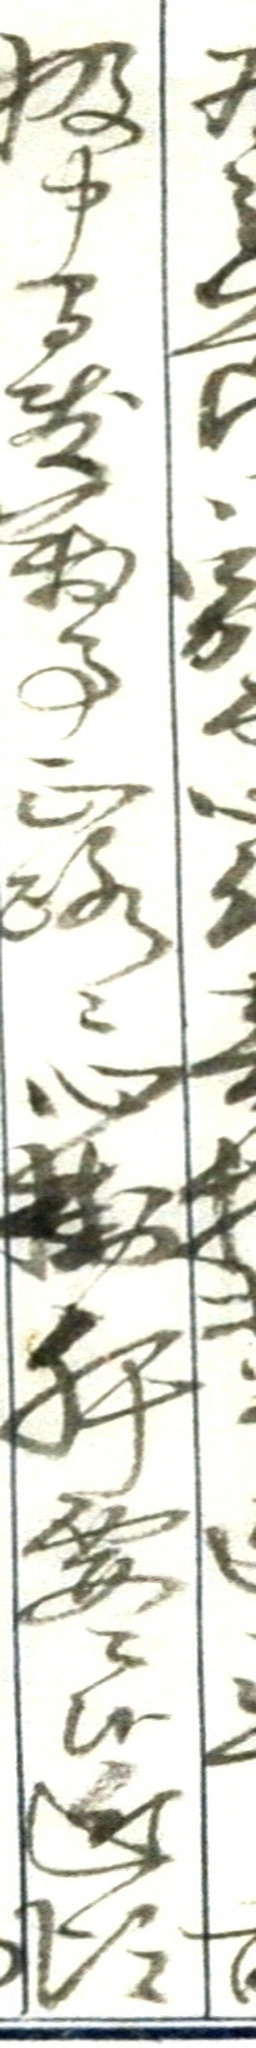扱申間敷萬事正路に心掛肝要に候近頃
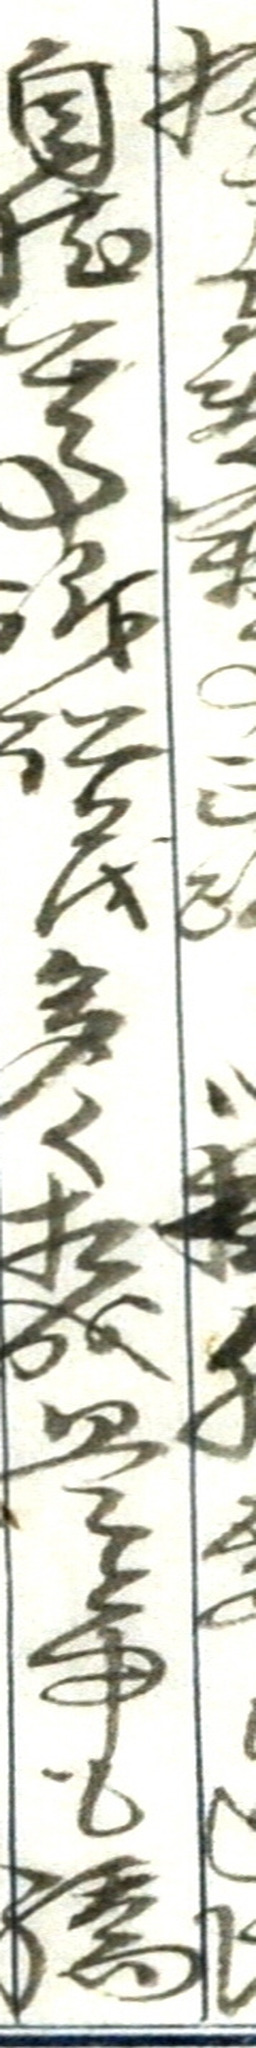自然公事訴訟も茂多く相成是と申も驕
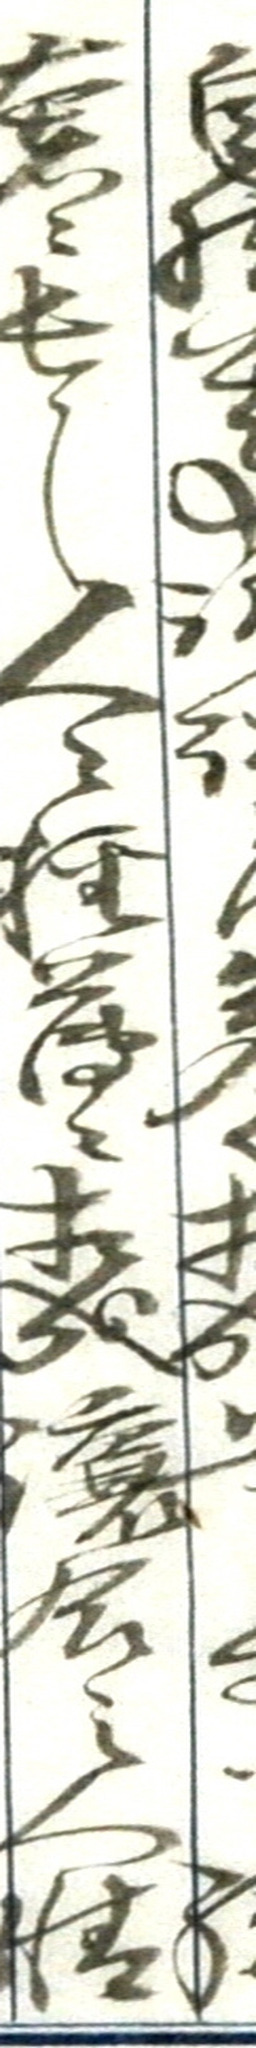奢に長し人々軽薄ニ相成譲合之人情
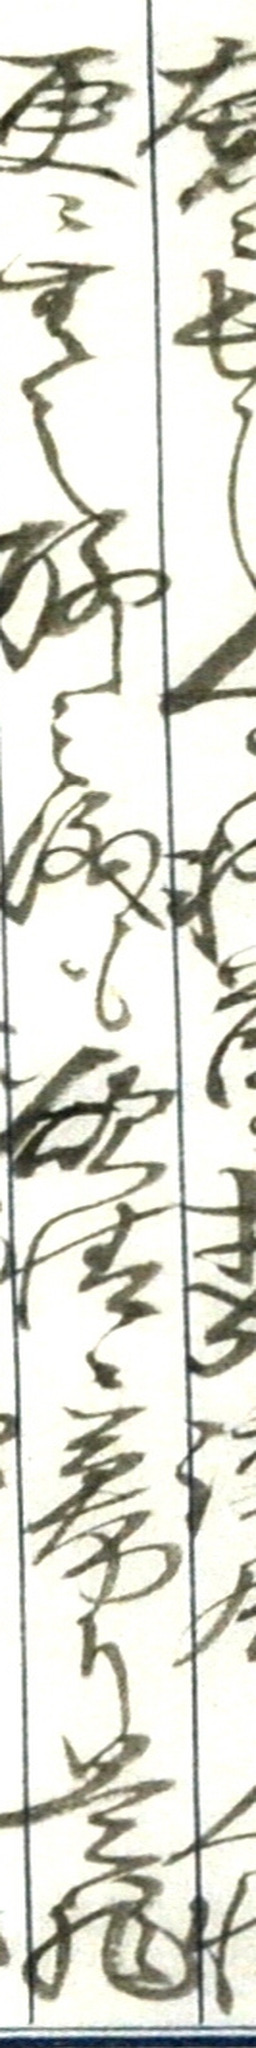更ニ無之聊之儀も欲情ニ募り是非
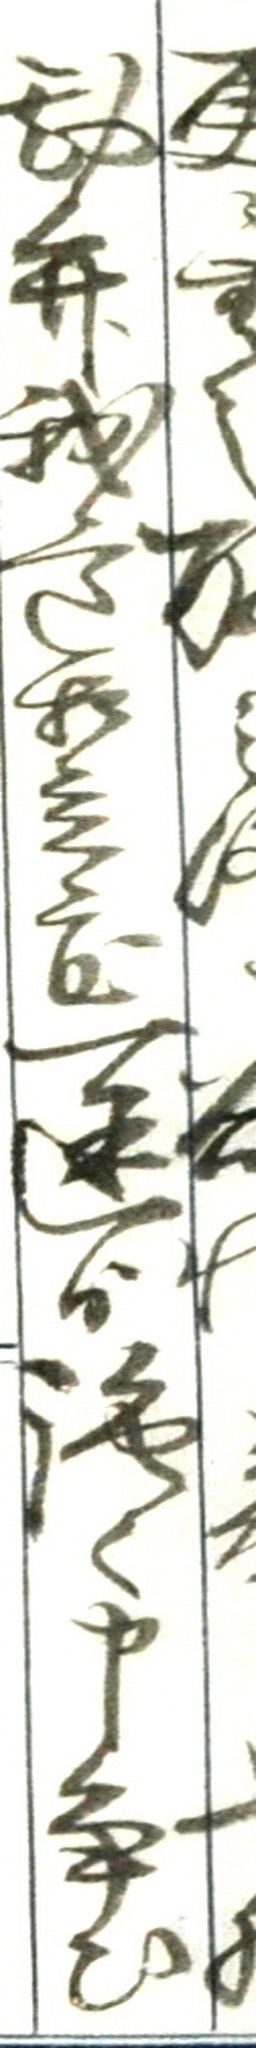勘弁我意相立度一途ゟ強く申争ひ

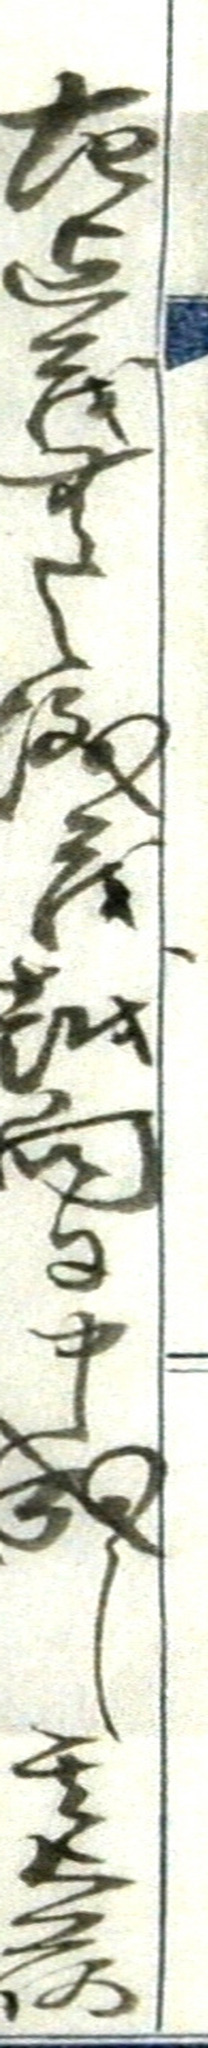左迄茂無之儀茂越向に申成し其上荷
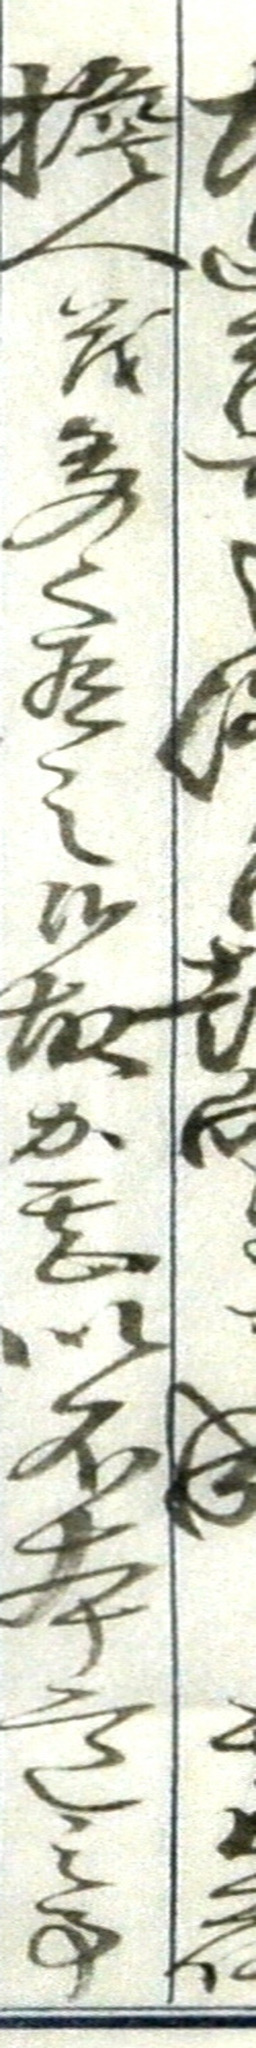担人茂多く有之候故か甚以不本意之事
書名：御触書
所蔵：伊那市立高遠町図書館・合同会社AMANE
